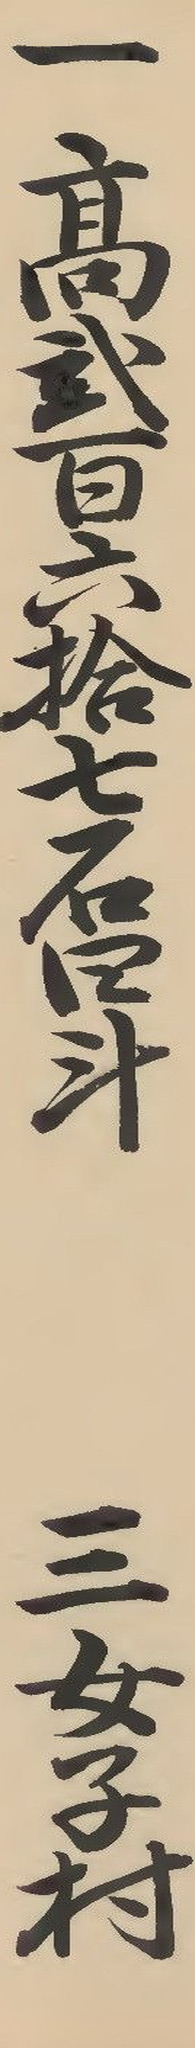一高弐百六拾七石四斗三女子村

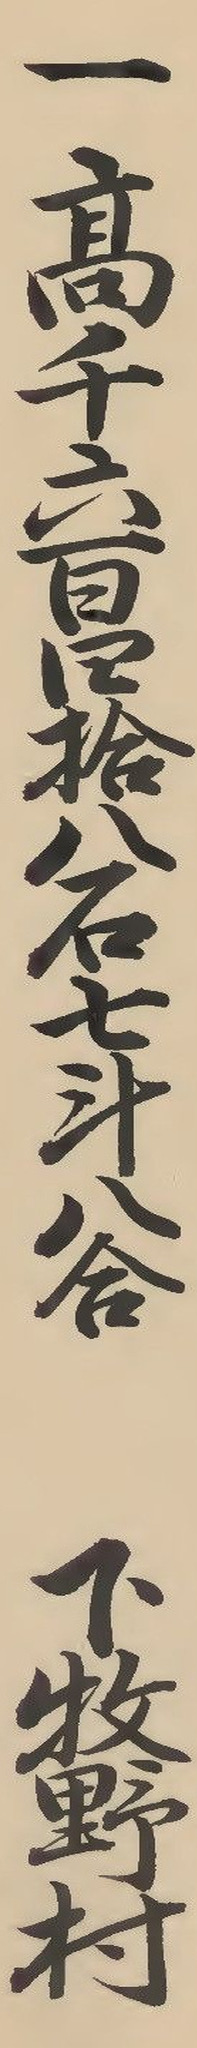一高千六百四拾八石七斗八合下牧野村
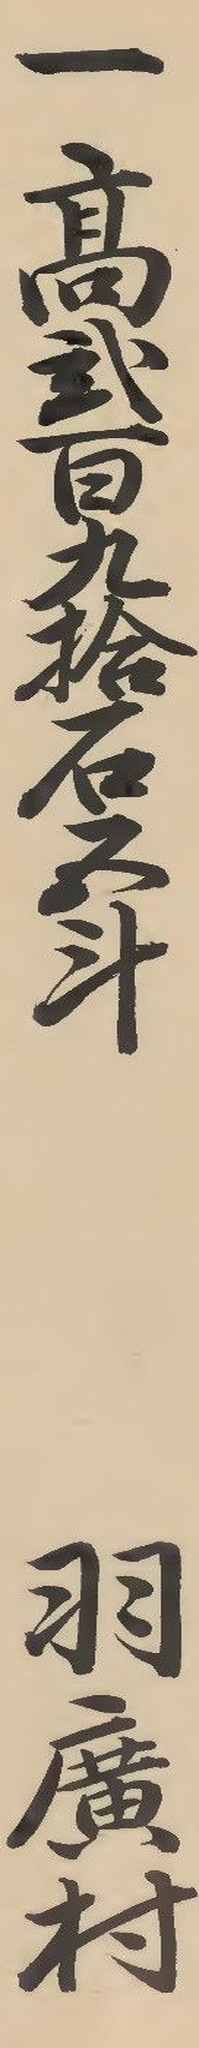一高弐百九拾石五斗羽広村
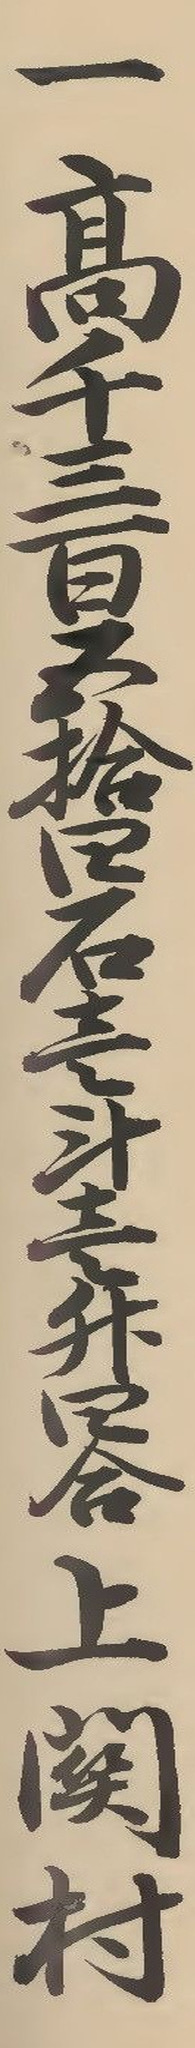一高千三百五拾四石壱斗壱升四合上関村
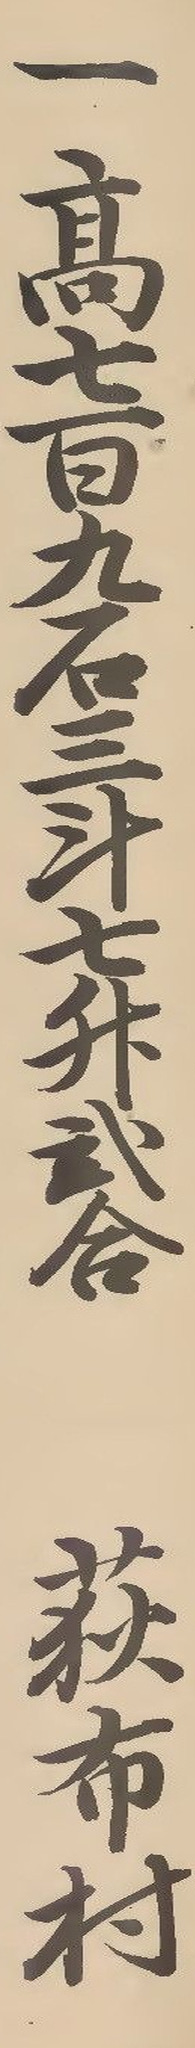一高七百九石三斗七升弐合荻布村
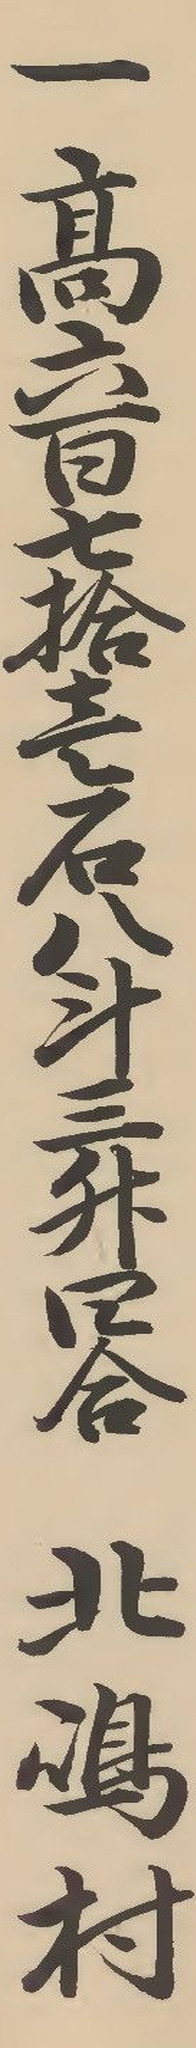一高六百七拾壱石八斗三升四合北島村
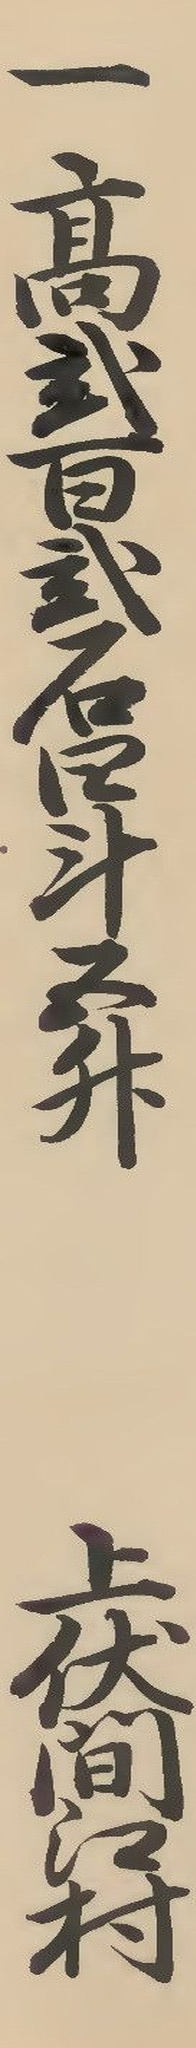一高弐百弐石四斗五升上伏間江村
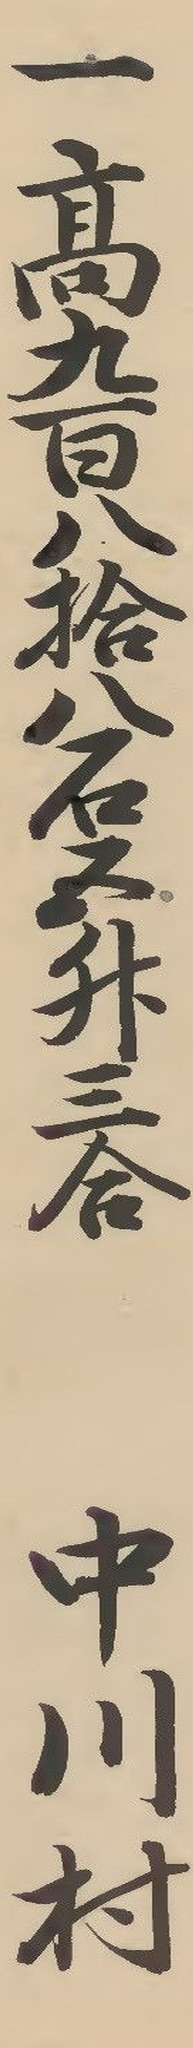一高九百八拾八石五升三合中川村

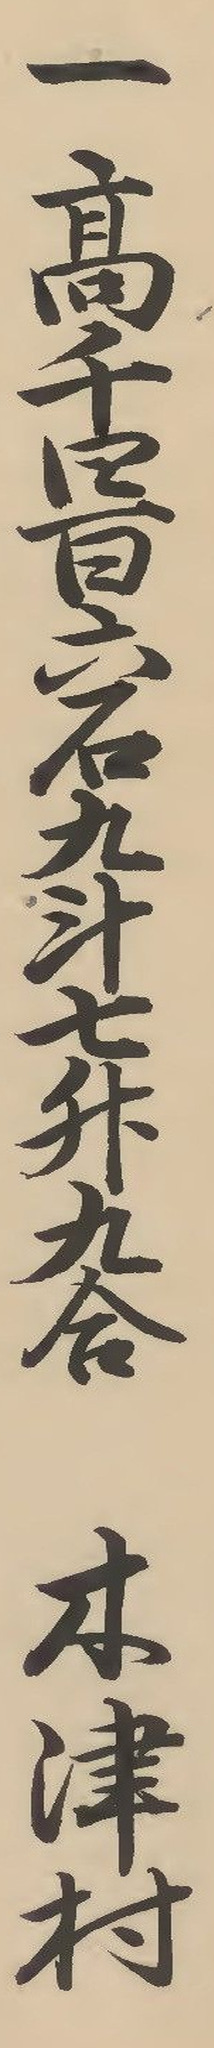一高千四百六石九斗七升九合木津村
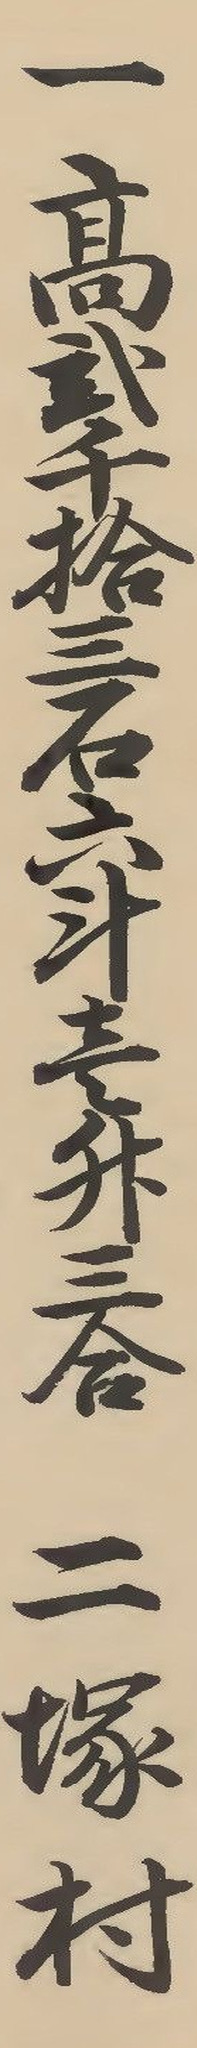一高弐千拾三石六斗壱升三合二塚村
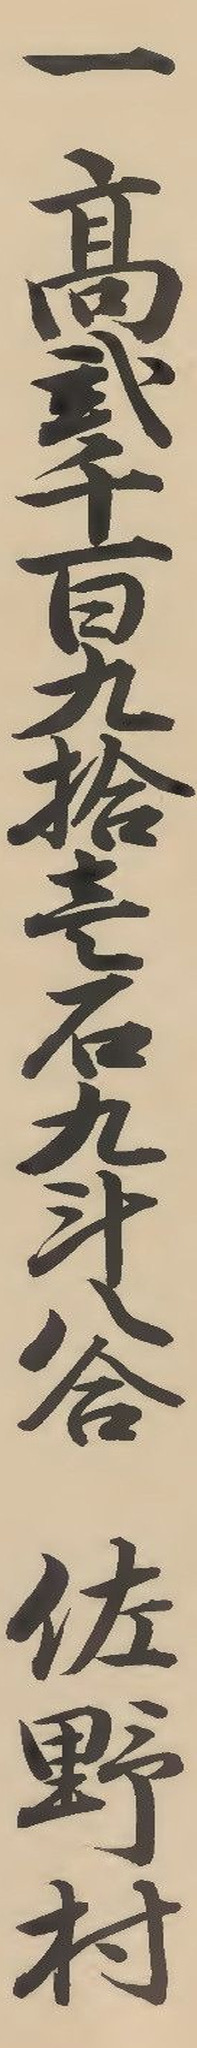一高弐千百九拾壱石九斗八合佐野村
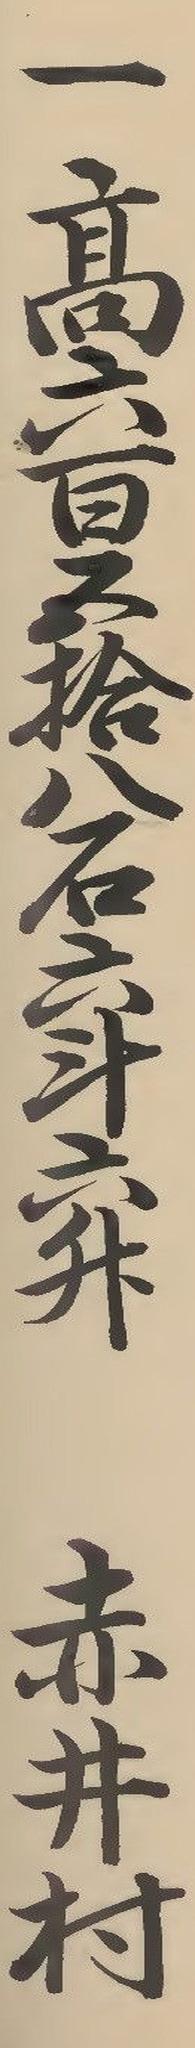一高六百五拾八石六斗六升赤井村
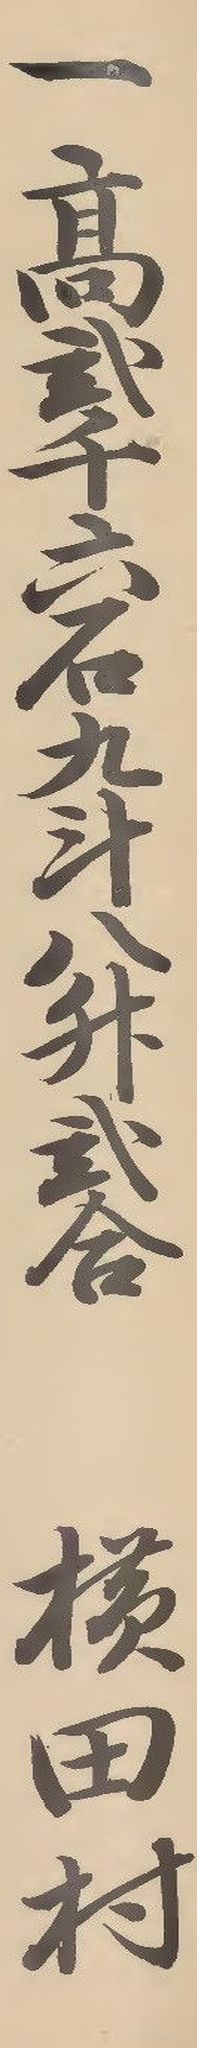一高弐千六石九斗八升弐合横田村
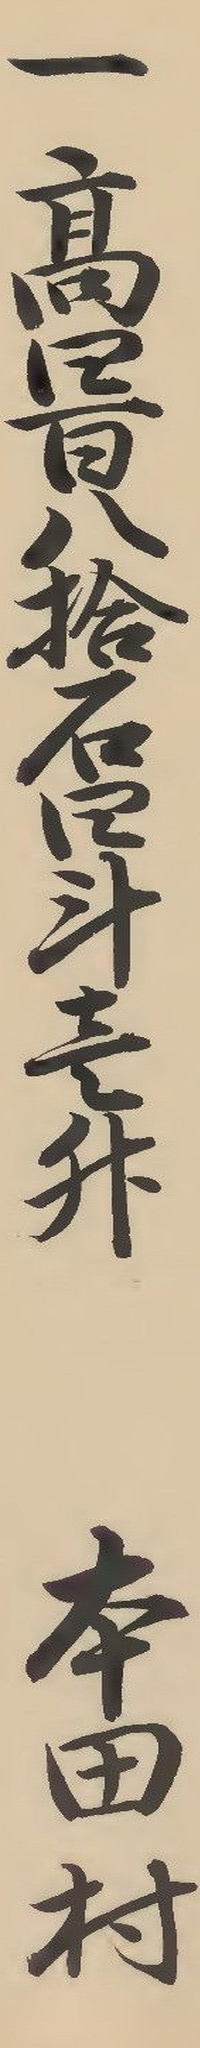一高四百八拾石四斗壱升本田村
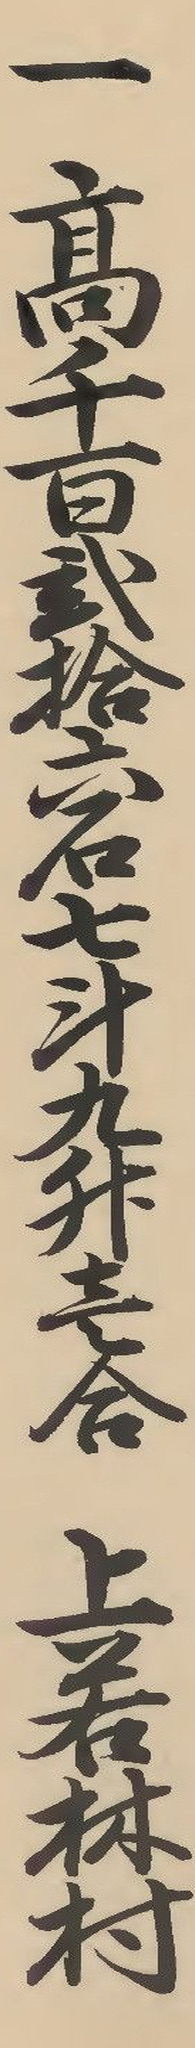一高千百弐拾六石七斗九升壱合上若林村

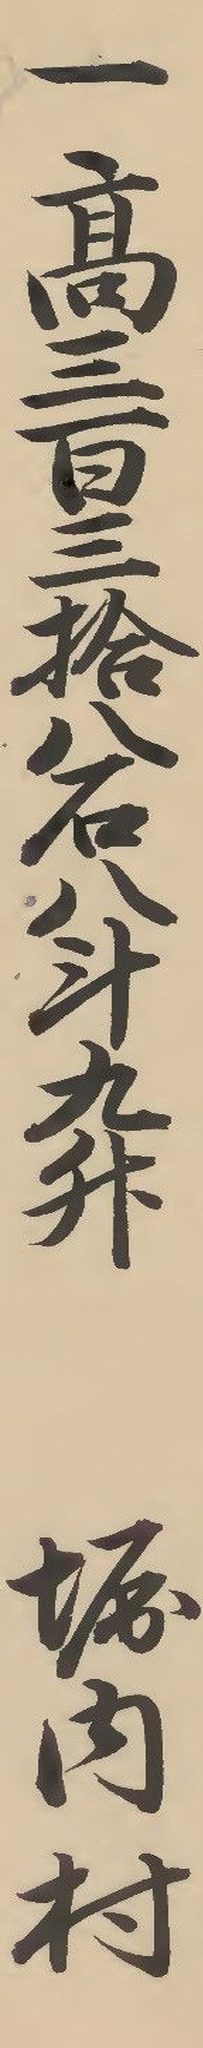一高三百三拾八石八斗九升堀内村
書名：越中国郷帳
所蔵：国立公文書館 National Archives of Japan
